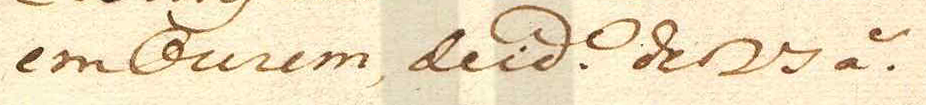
em Ourem, de id.e de 27 a.s
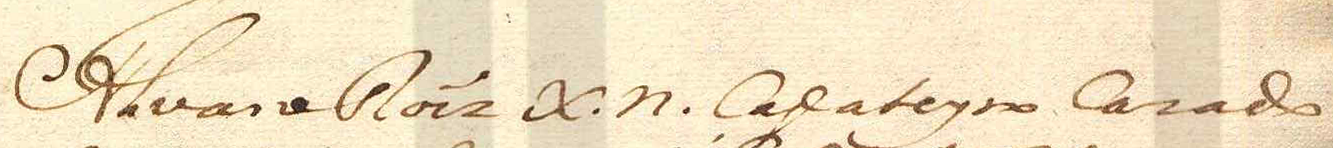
Alvaro Roiz̄ x. n. Çapateyro cazado
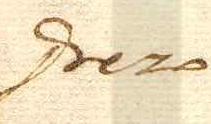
prezo
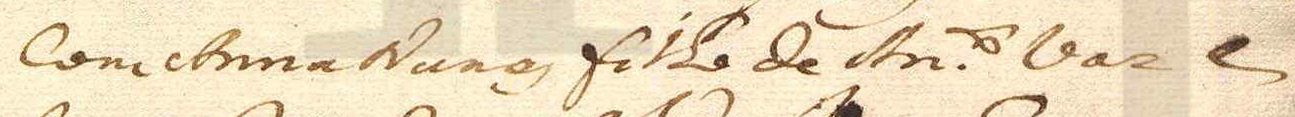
com Anna Nunes filho de An.to Vaz e
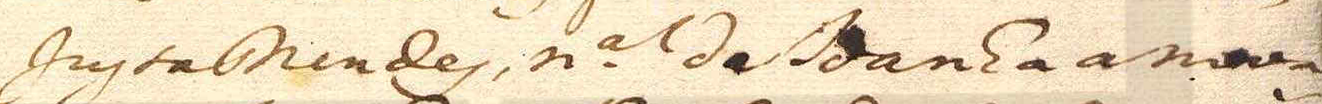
Justa Mendes, n.al da Idanha a nova
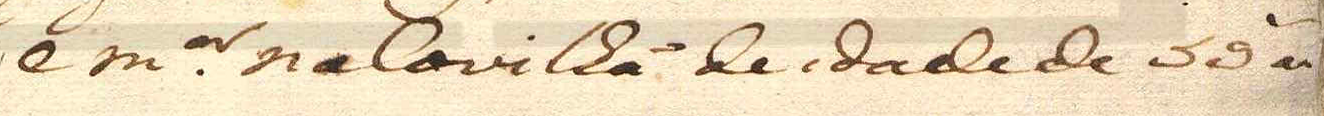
e m.or na Covilhã de idade de 59 ā
